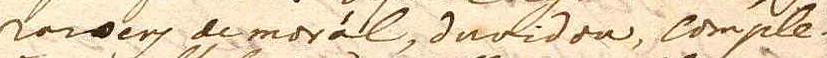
razoens de moral, duvidou, comple
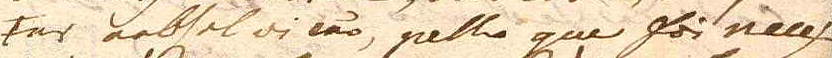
tar a absolvicão, pello que foi neces
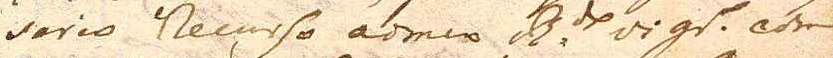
sario Recurso ao meo R.do vigr.o
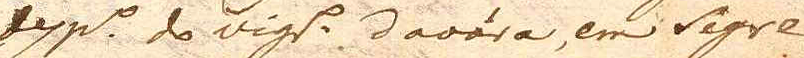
desp.o do vigr.o da vára, em segre
